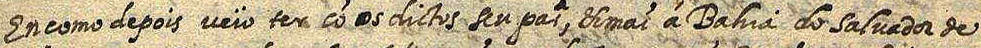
En como depois ueio ter cō os dictos seu pai & maĩ á Bahia do Saluador de
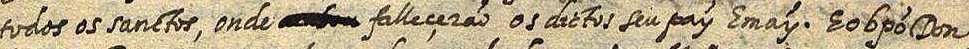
todos os sanctos, onde acabou falleçeraõ os dictos seu paȳ E maỹ. E o bpō Don
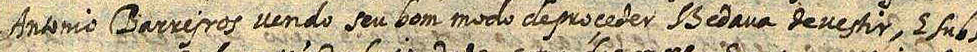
Antonio Barreijos uendo seu bom modo de proçeder lhe daua de uestir, E subs
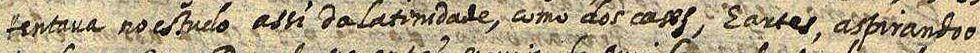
tentaua no estudo assi da Latinidade, como dos casos, E artes, aspirando o
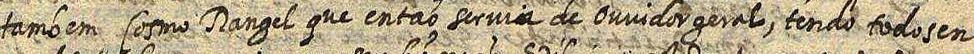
também Cosmo Rangel que entaõ seruia de Ouuidor geral, tendo todos en
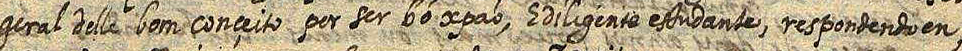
geral delle bom conçeito por ser bō xpaõ, E diligente estudante, respondendo en
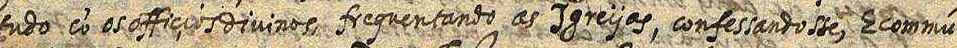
tudo cō os offiçios diuinos, frequentando as Igreijas, confessandosse, E commū
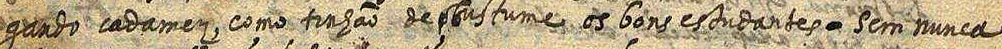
gando cada mez, como tinhaõ de custume os bons estudantes _ sem nunca
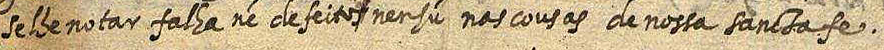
se lhe notar falha nē defeitos nenhū nas cousas de nossa sancta fe.
